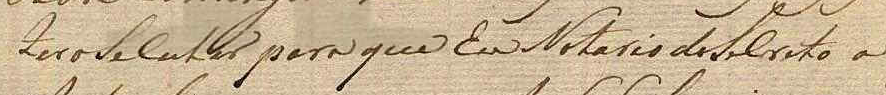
tero Secular para que Eu Notario do SeCreto a
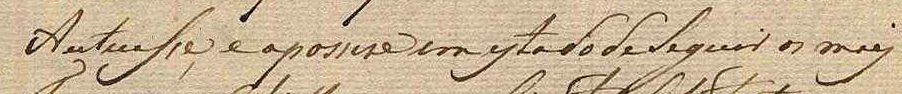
Autuasse, e a possese em estado de seguir os mais
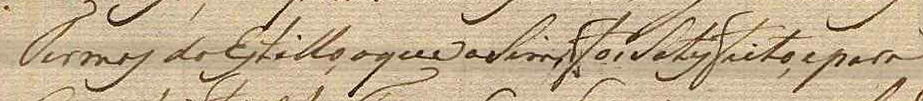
Termos do Estillo, o que asim foi satisfeito, e para
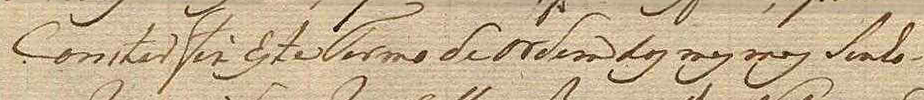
Constar fiz este Termo de ordem dos mesmos Senho
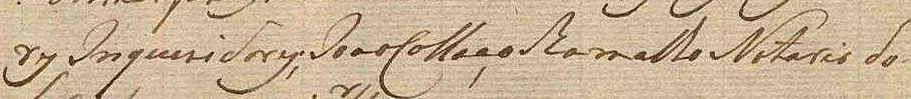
res Inquizidores, Ioaõ Collaço Ramalho Notario do
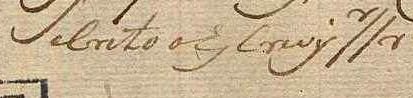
Secreto o escrevy //
